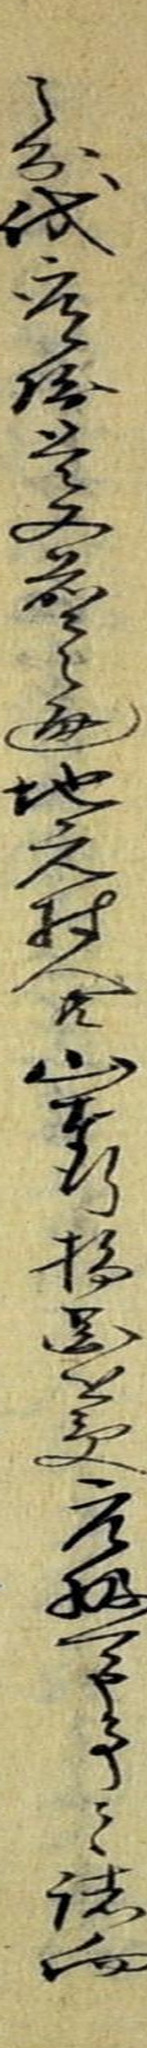之分伐取候儀是又前々之通地元村人共山奉行指図を受取扱可申事ニ候諸向
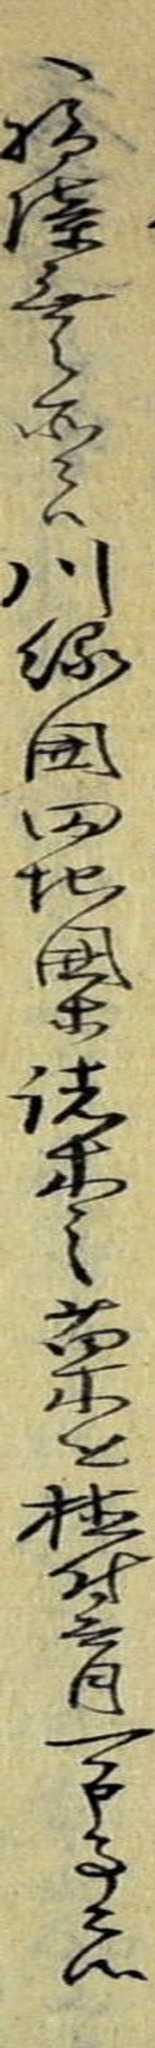へ指障無之所ニハ川縁囲田地囲等諸木々之苗木を植付育可申事ニ候
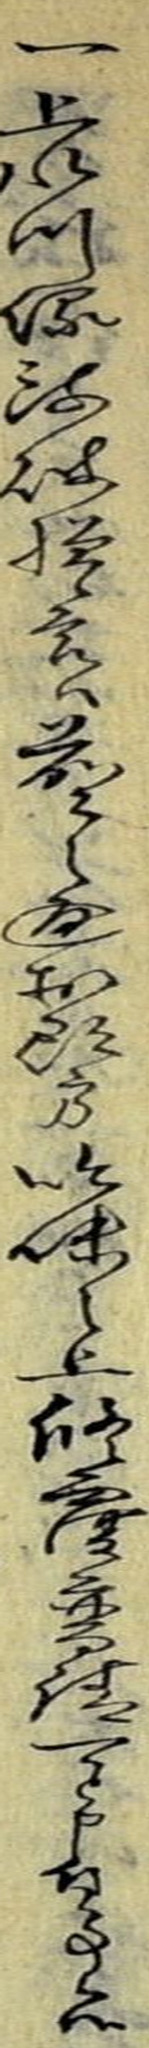一上水川縁致破損候節ハ前々之通於郡方吟味之上修覆普請可被申付事ニ候
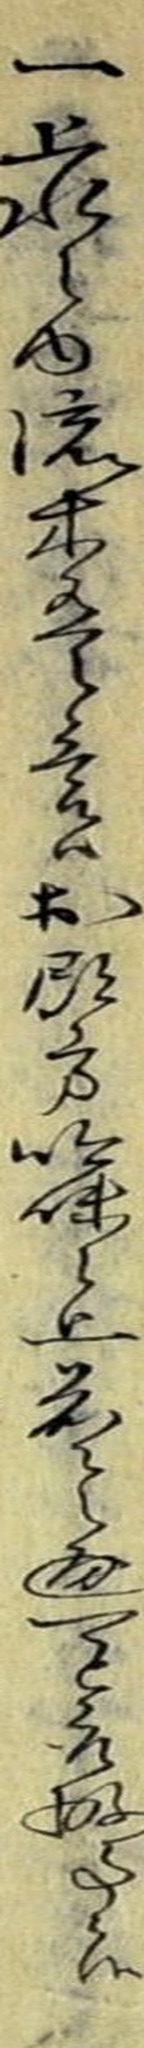一上水之内流木有之節ハ於郡方吟味之上前々之通可被取扱事ニ候
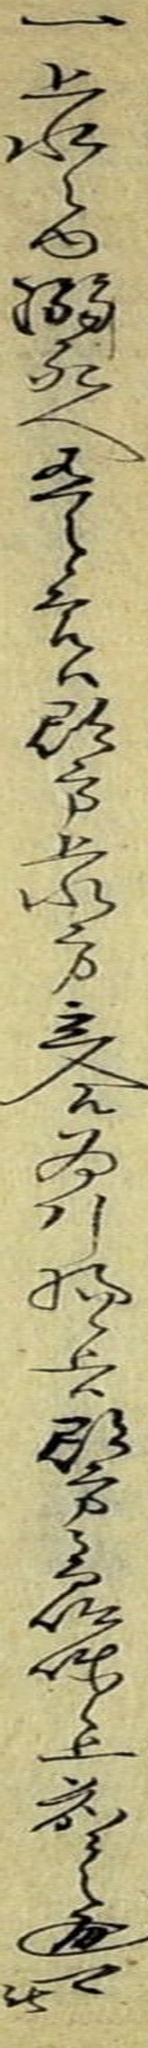一上水之内溺死人有之候節ハ郡方上水方立合為引揚候上ハ郡方ニ而吟味之上前々之通可被
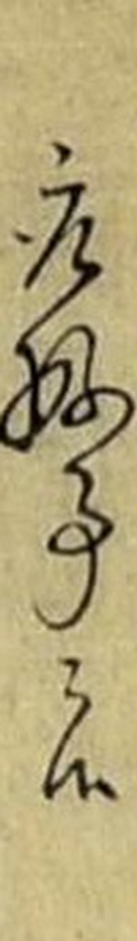取扱事ニ候
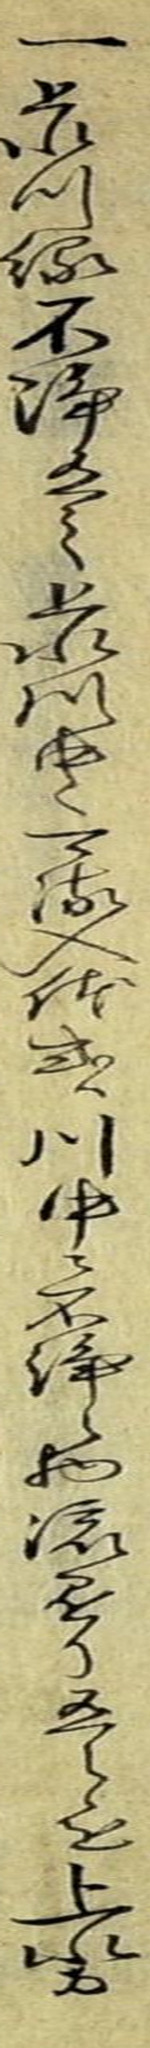一上水縁不浄有之上水川中へ可流入体或ハ川中ニ不浄之物流懸り有之を上水方
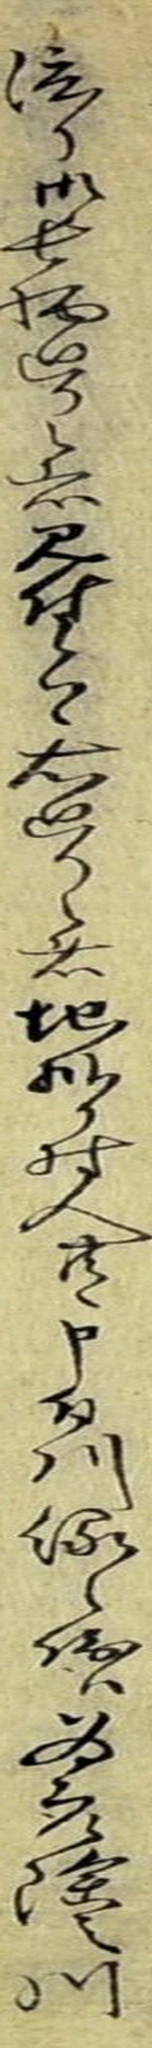渡り御長柄廻り之者見付候ハヽ右廻り之者地掛り村人共へ申付川縁之儀ハ為取除之川
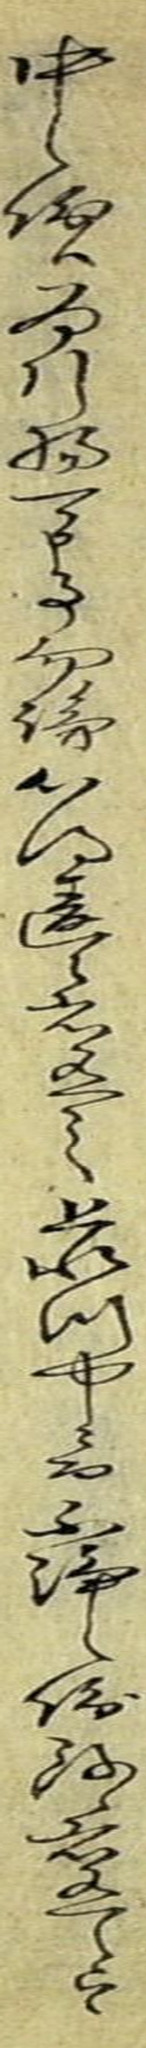中之儀ハ為引揚可申事勿論心得違之者有之上水川中ニ而不浄之儀致候者有之候ハヽ
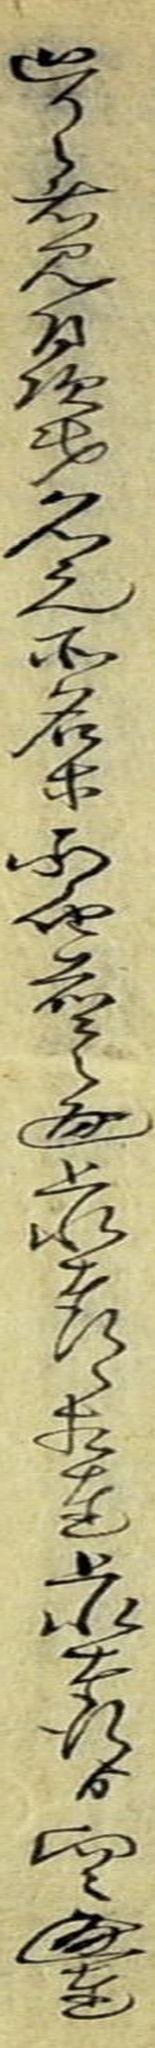廻り之者見付次第名元所名等承届前々之通上水奉行へ相達上水奉行ゟ向々通達
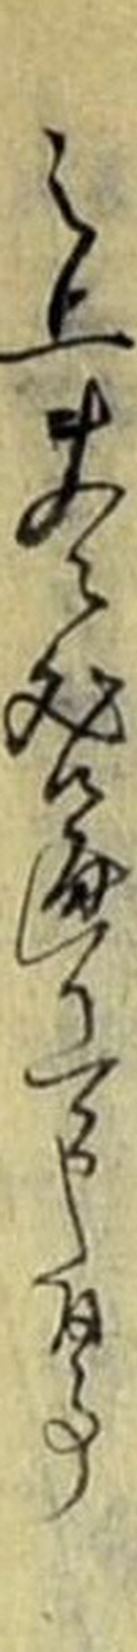之上夫々咎通り可申付事
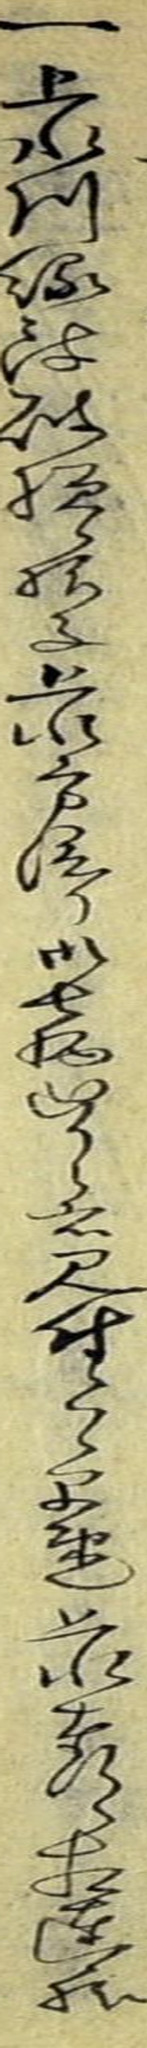一上水川縁致破損候様子上水方渡り御長柄廻り之者見付候ハヽ早速上水奉行へ相達候様
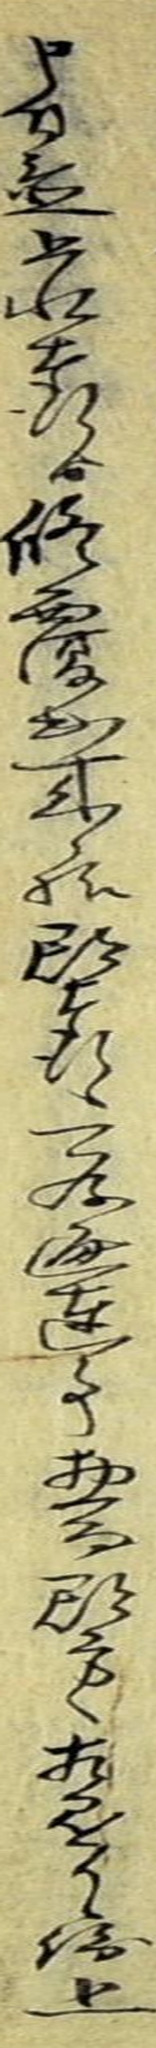申付置上水奉行ゟ修覆出来候様郡奉行へ可及通達事惣而郡方へ相懸り候儀上
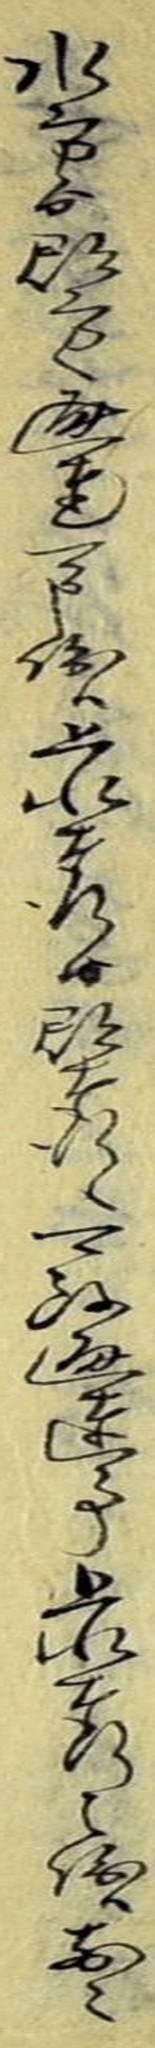水方ゟ群方へ通達可申儀ハ上水奉行ゟ郡奉行へ可致通達事上水奉行之儀ハ前々

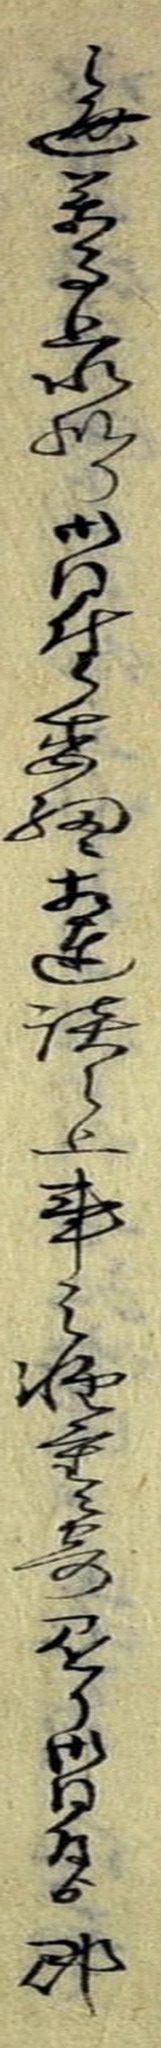之通万事上水掛り御目付へ委細ニ相達談候上事之軽重ニ寄懸り御目付ゟ郡
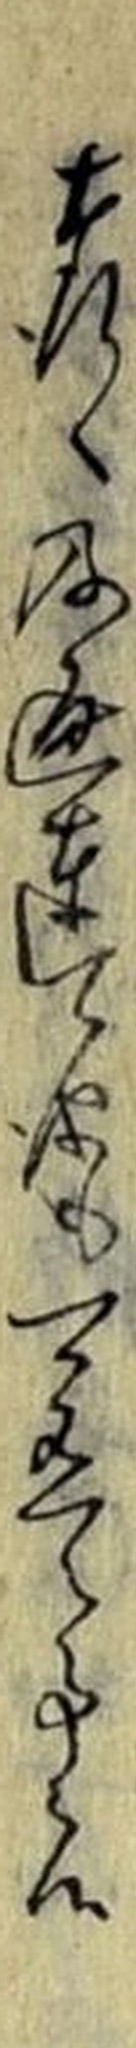奉行へ及通達候儀も可有之事ニ候
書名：命令之部 三
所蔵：福井県文書館 Fukui Prefectural Archives
